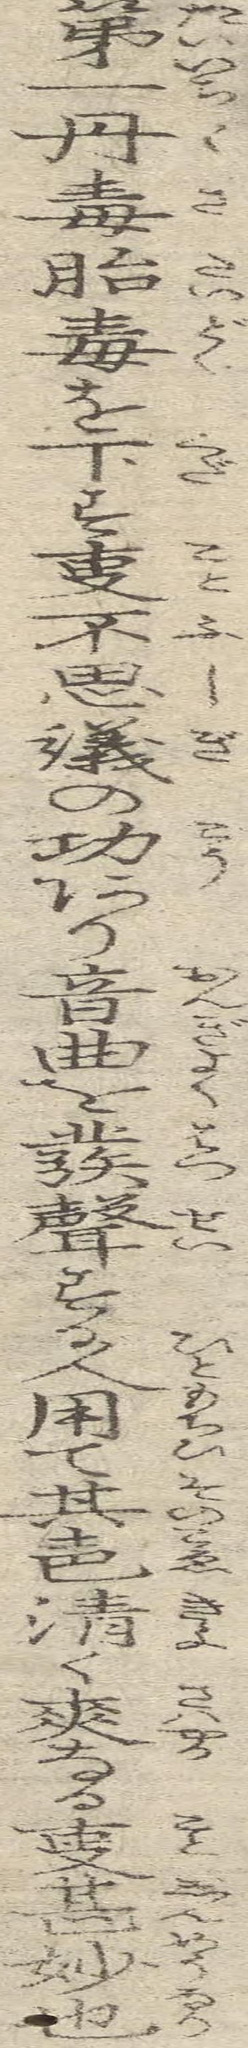第一丹毒胎毒を下す事不思議の功あり音曲を発声する人用て其声清く爽なる事甚妙也
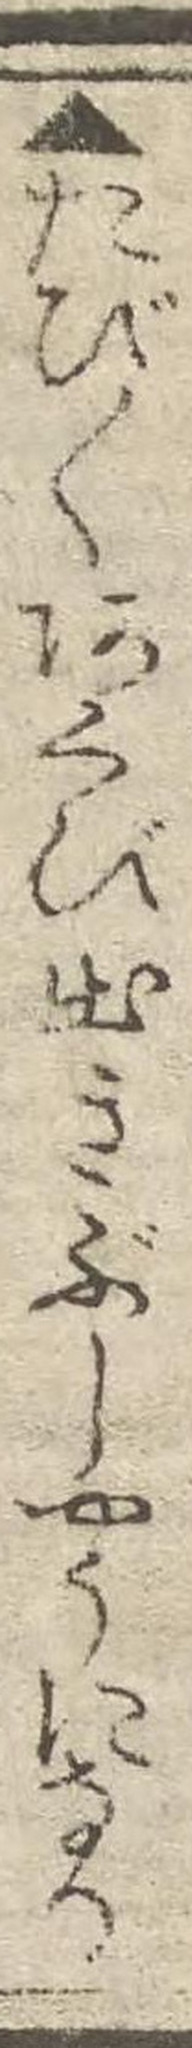▲たび〳〵あくび出きぶしやうになり
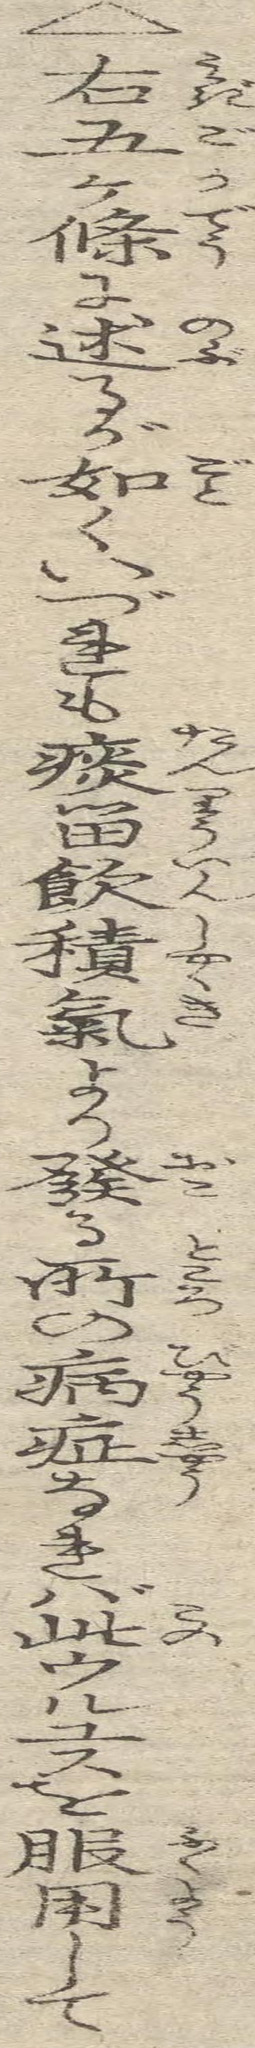△右五ヶ条に述るが如くいづれも痰留飲積気より発る所の病症なれば此ウルユスを服用して
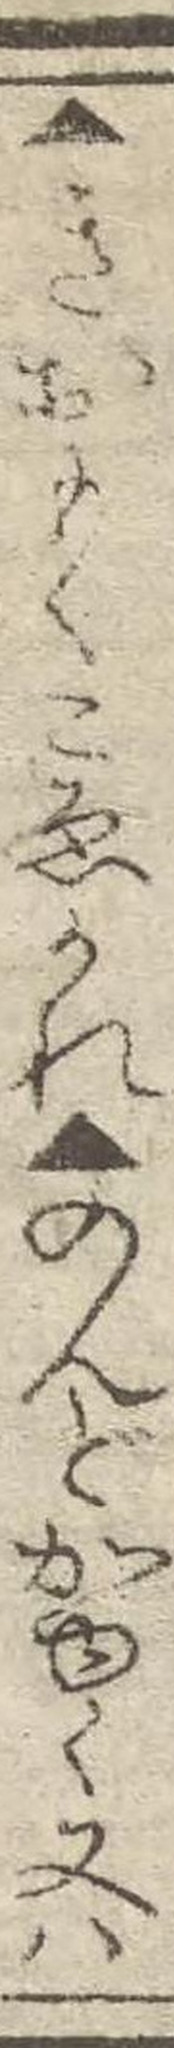▲きおもくこゑかれ▲のんどかゆく又は
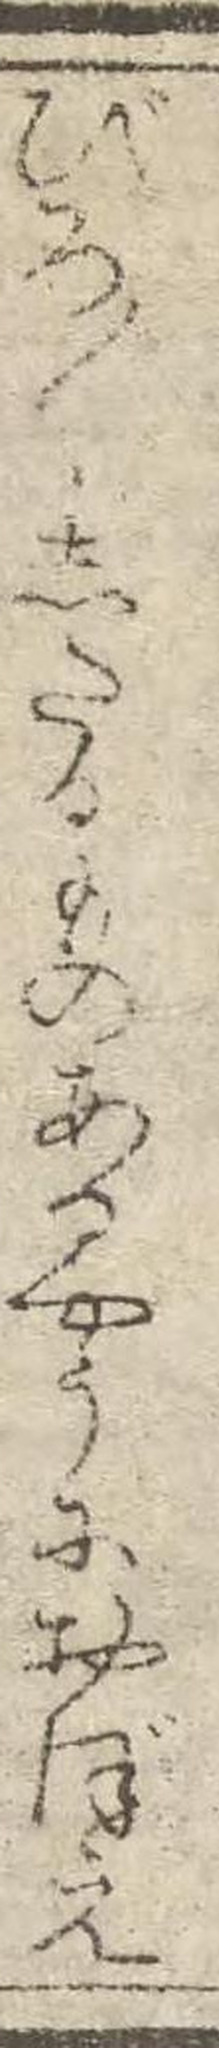びろ〳〵したるものあるやうにおぼえ
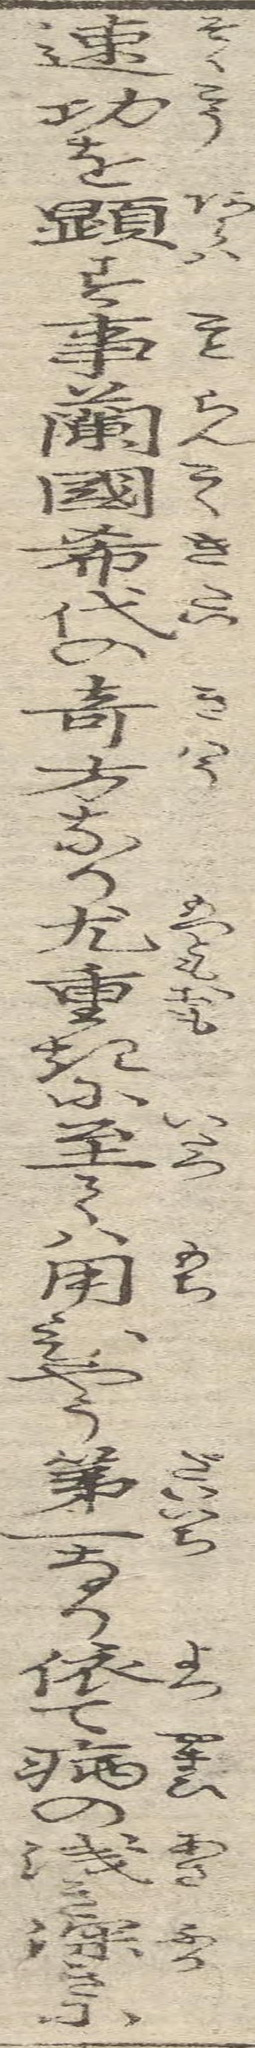速功を顕す事蘭国希代の奇方なり尤重きに至ては用ひやう第一なり依て病の浅き深きに
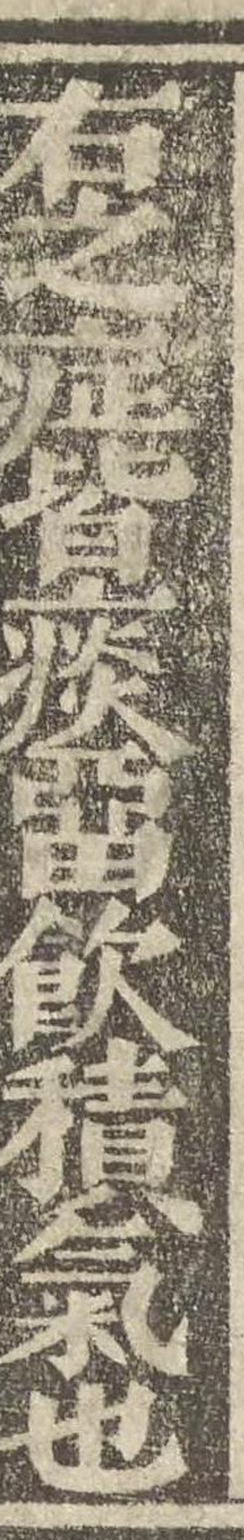右之症皆痰留飲積気也
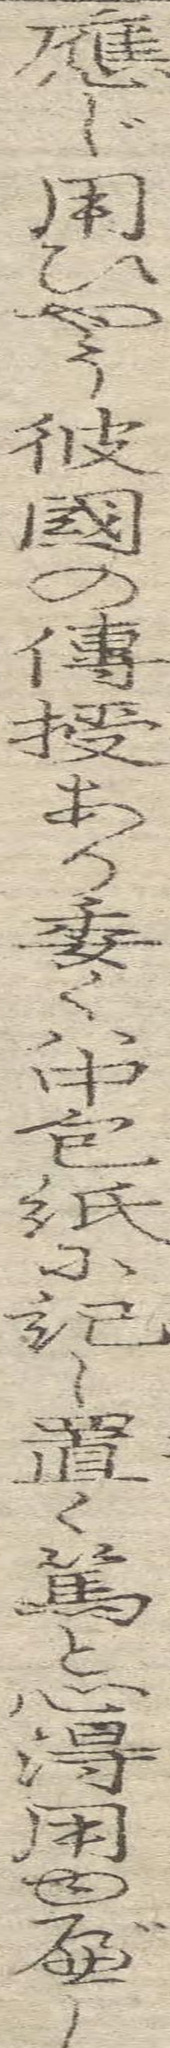応じ用ひやう彼国の伝授あり委くは中包紙に記し置く篤と心得用ゆべし
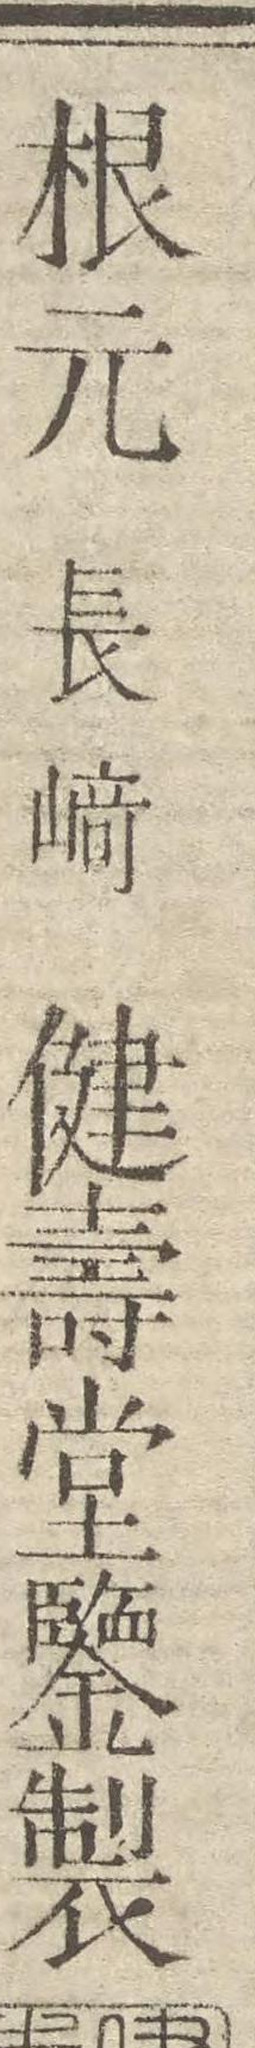根元長崎健寿堂鑑製
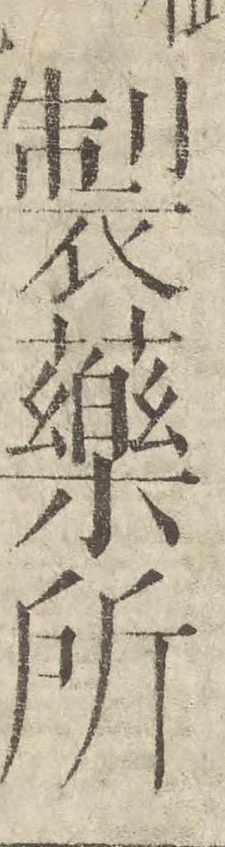製薬所
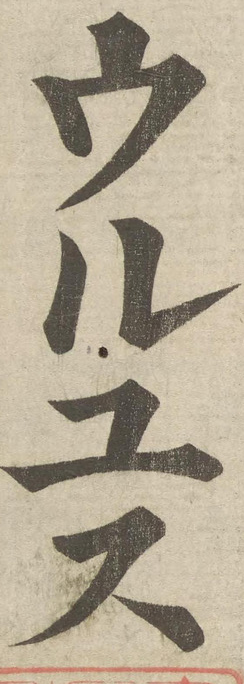ウルユス

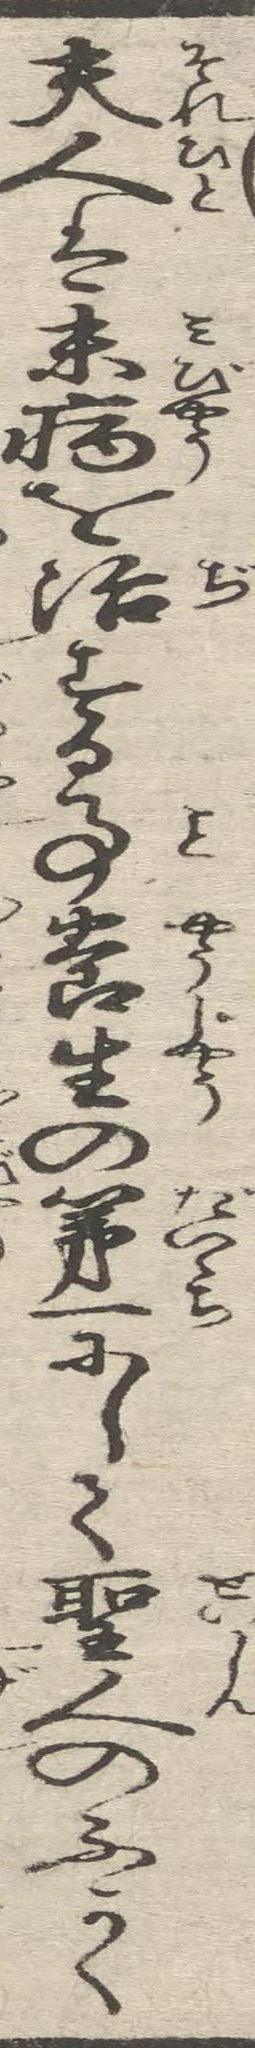夫人は未病を治する事養生の第一にして聖人のふかく
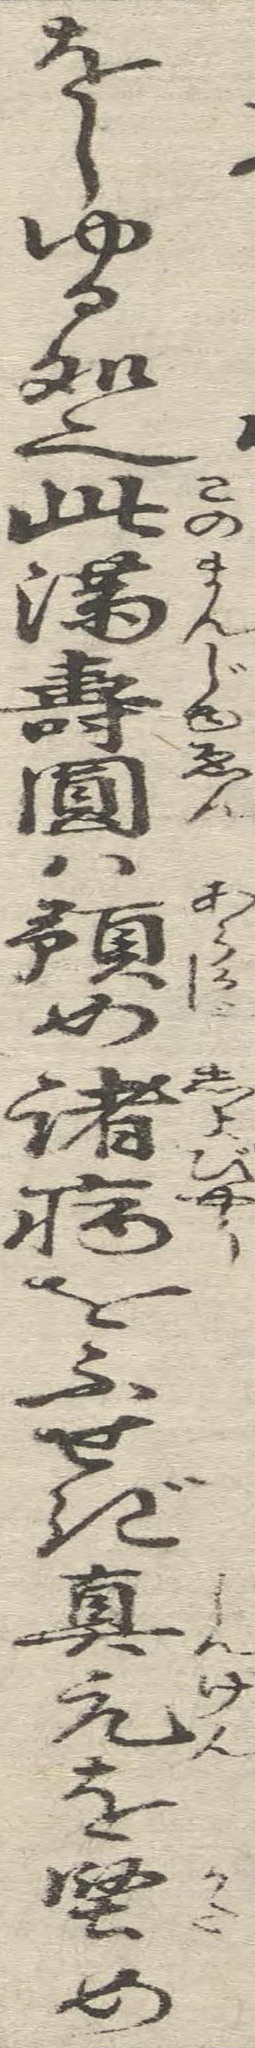をしゆる処也此満寿円は預め諸病をふせぎ真元を堅め
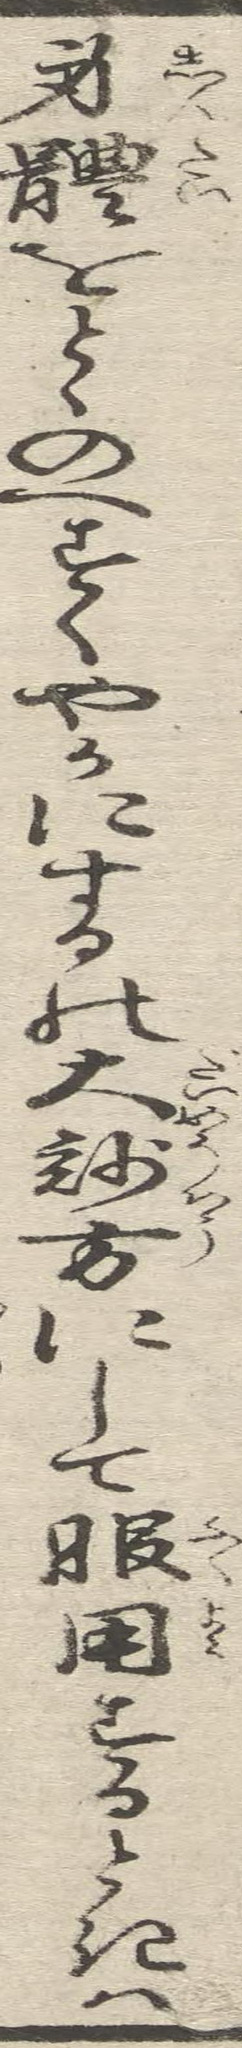身体をとゝのへすくやかにするの大妙方にして服用するときは
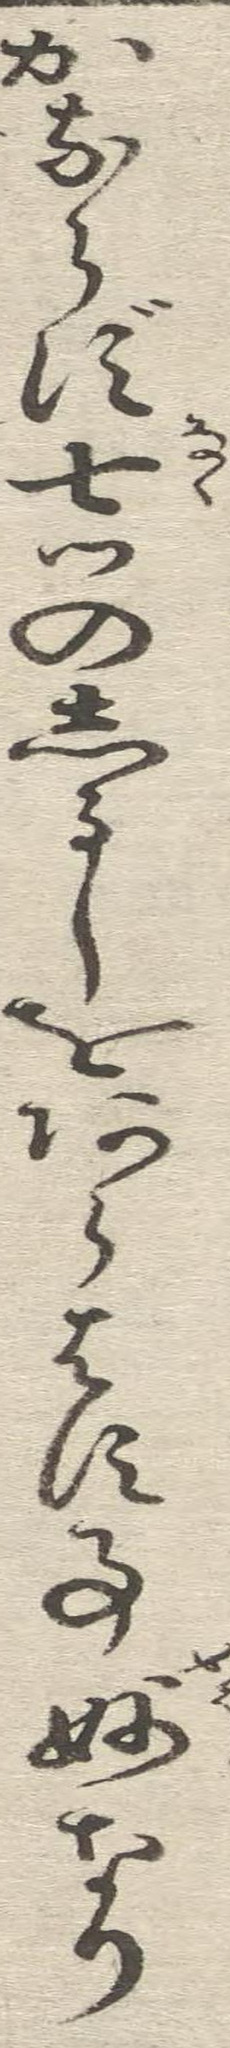かならず七ッのしるしをあらはす事妙なり
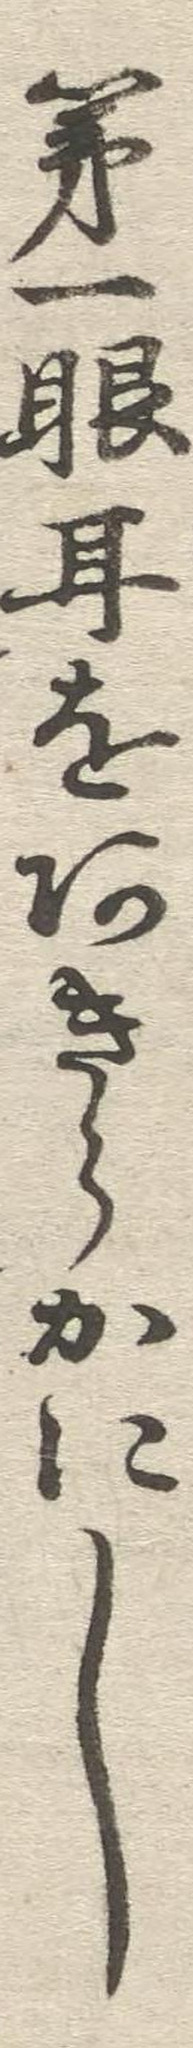第一眼耳をあきらかにし
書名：浪華薬種問屋能書張交帖. 一
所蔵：国立国会図書館 National Diet Library, JAPAN
